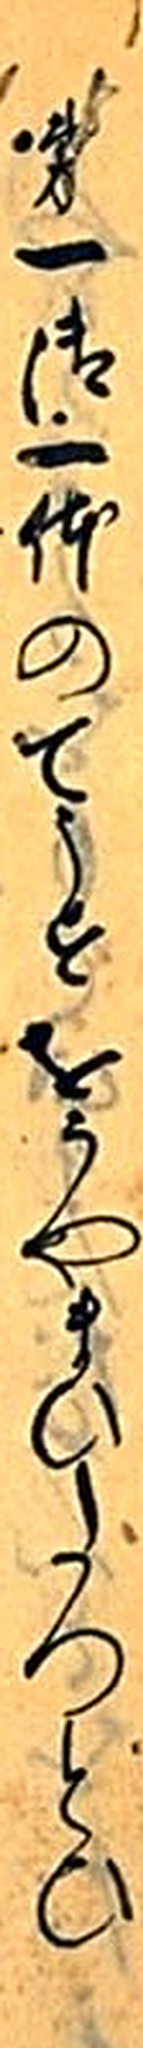第一御一体のてうすをうやまひたつとひ
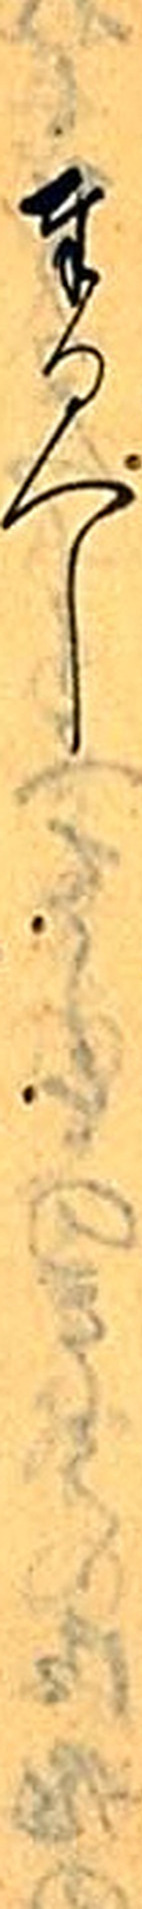奉るへし
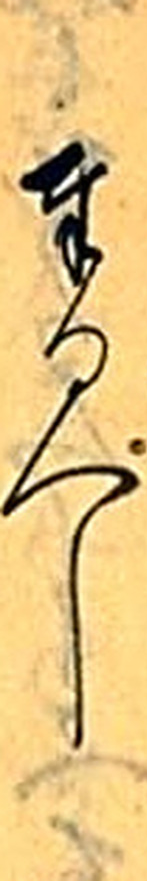奉るへし
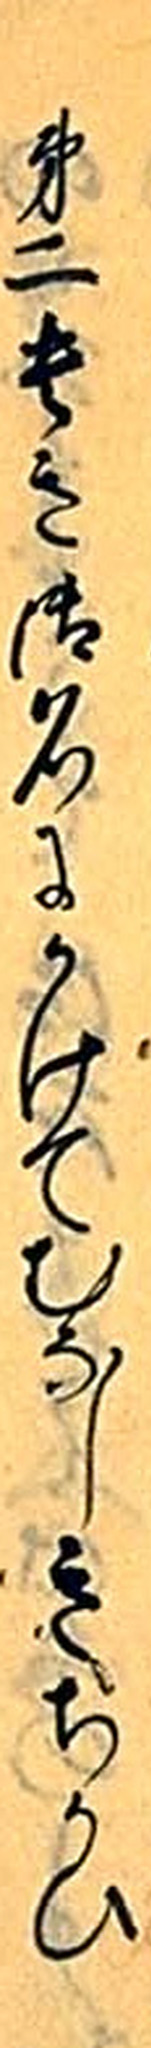第二貴き御名にかけてむなしきちかひ
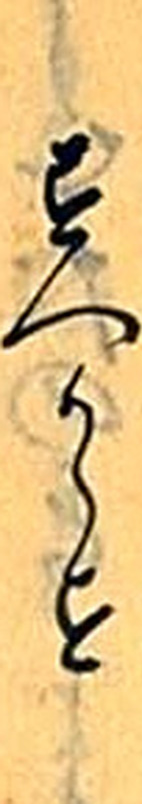すへからす
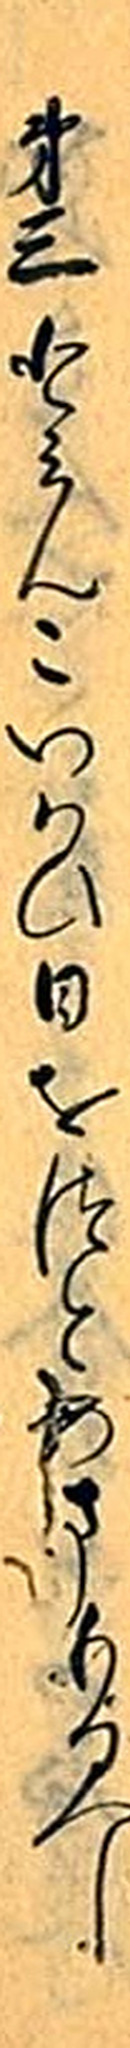第三とみんこいはい日をつとめまもるへし
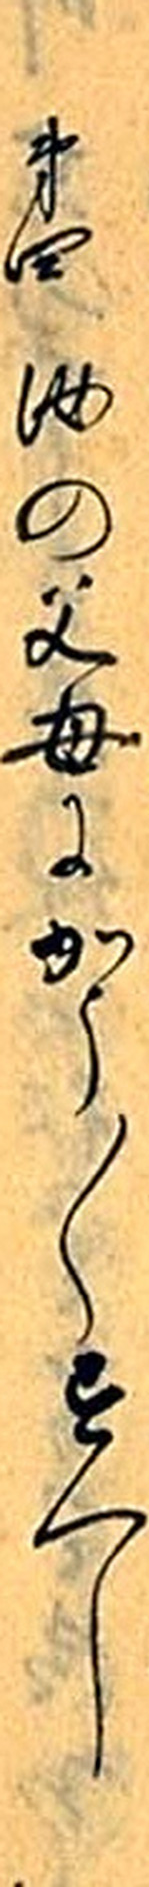第四汝の父母にかう〳〵をすへし
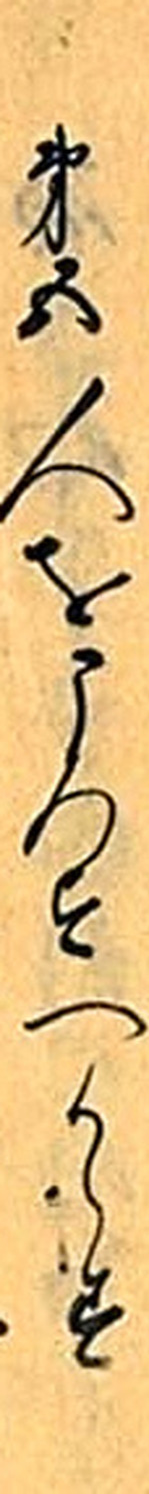第五人をころすへからす
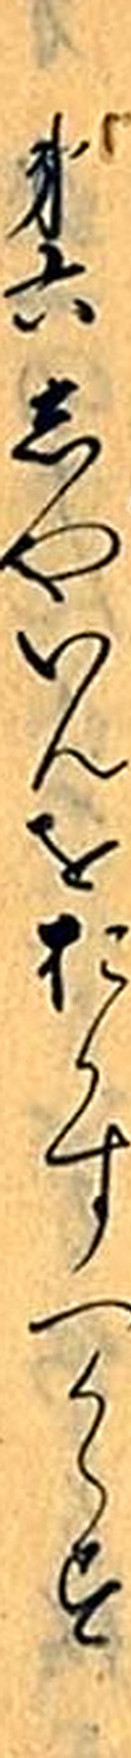第六しやいんをおかすへからす
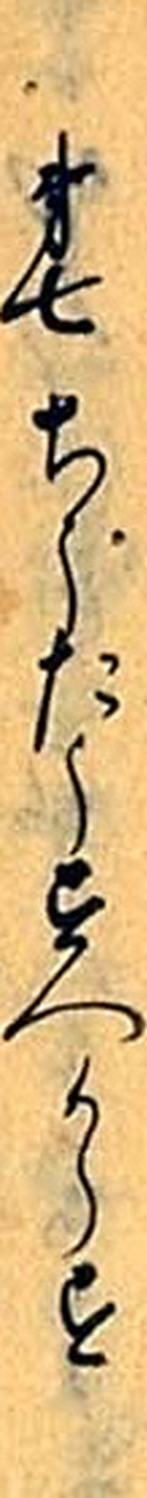第七ちうたうすへからす
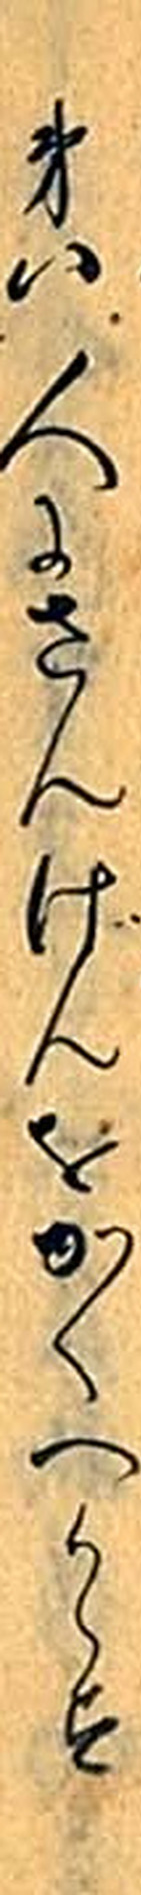第八人にさんげんをかくへからす
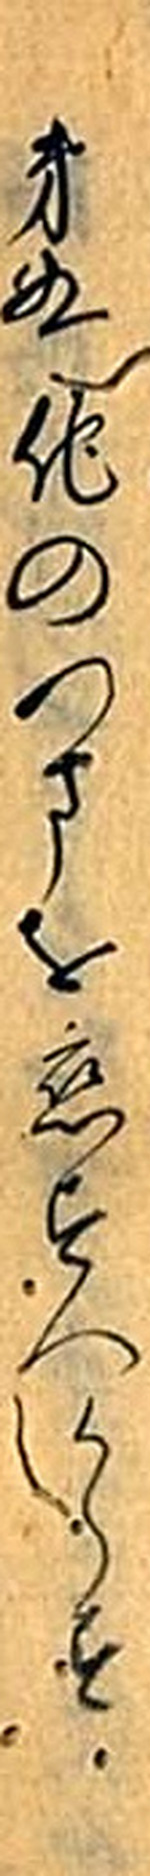第九他のつまを恋すへからす
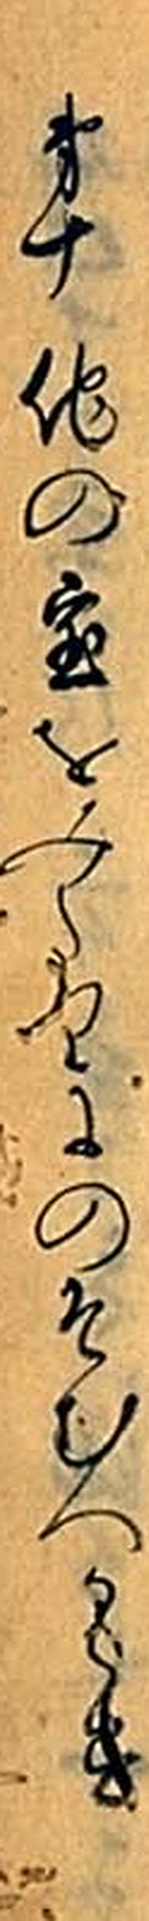第十他の宝をみたりにのそむへからす

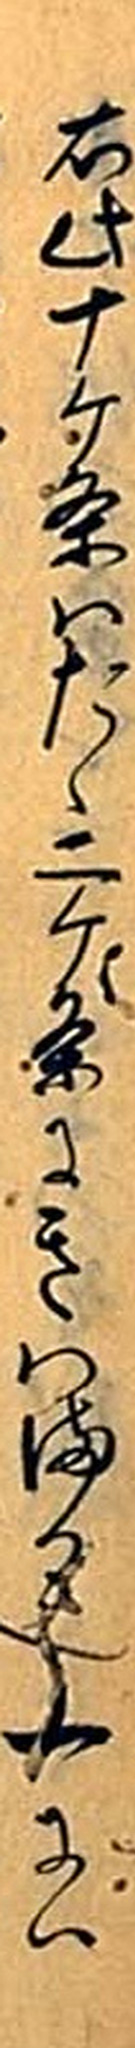右此十ケ条はたゝ二ケ条にきはまる也一には
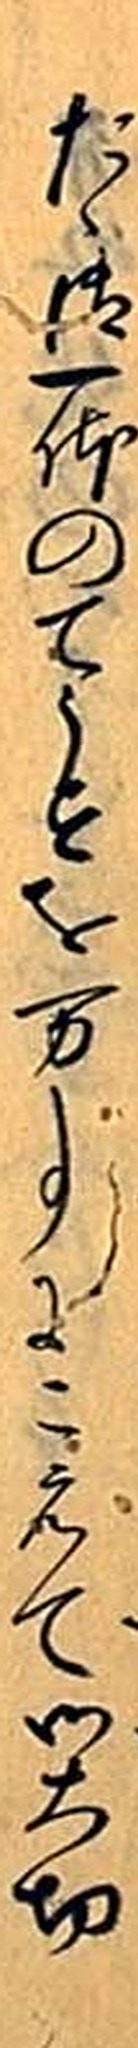たゝ御一体のてうすを万事にこえて御大切
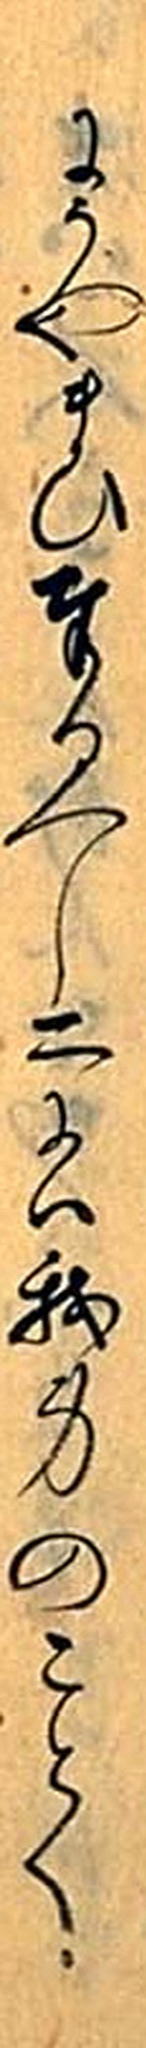にうやまひ奉るへし二には我身のことく
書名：ドチリナ・キリシタン
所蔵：東京大学総合図書館 / General Library in the University of Tokyo
